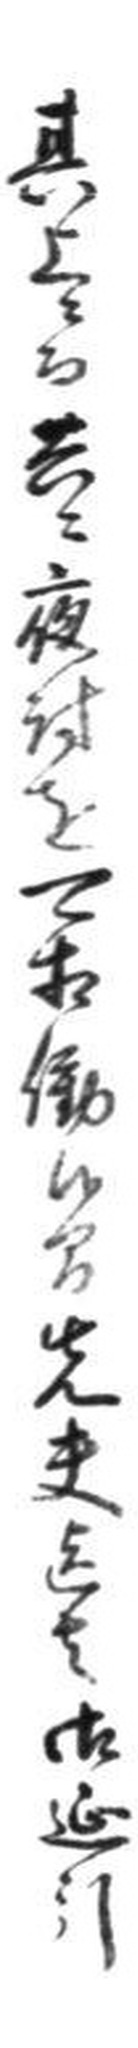其上ニ而共ニ夜討を可相働候間先夫迄者御延引
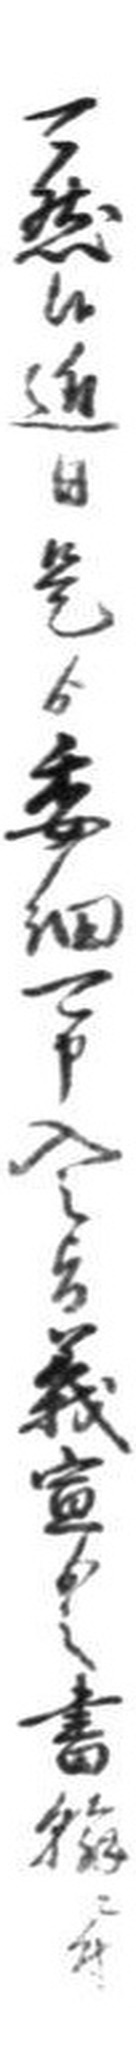可然候近日是ゟ委細可申入之旨義宣ゟ之書翰ニ付
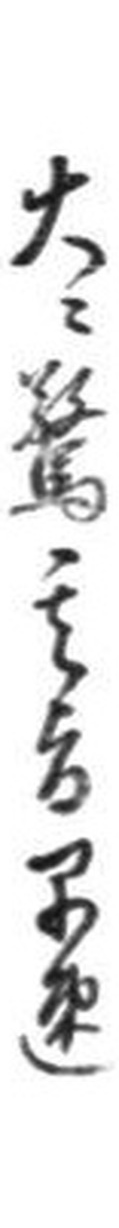大ニ驚其旨早速
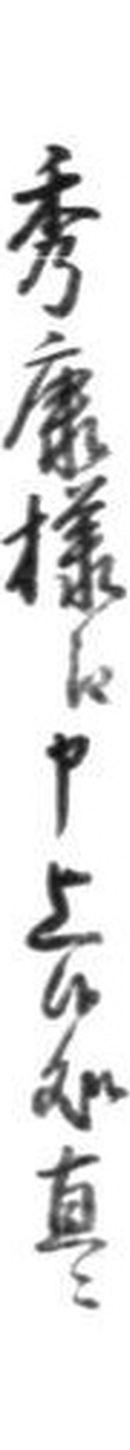秀康様江申上候処直ニ
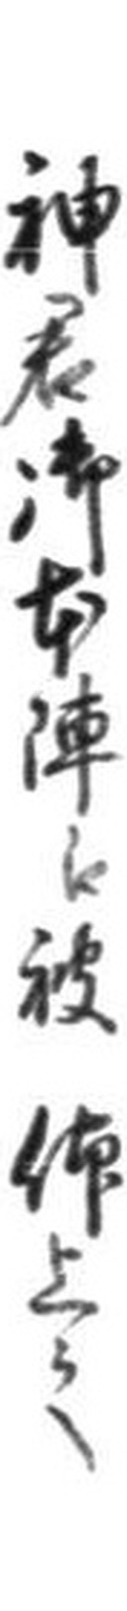神君御本陣江被仰上之
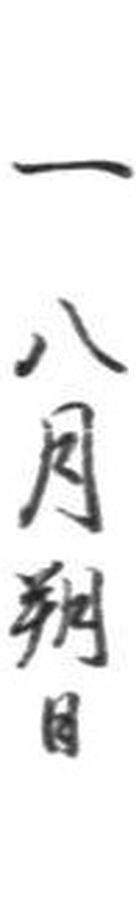一八月朔日
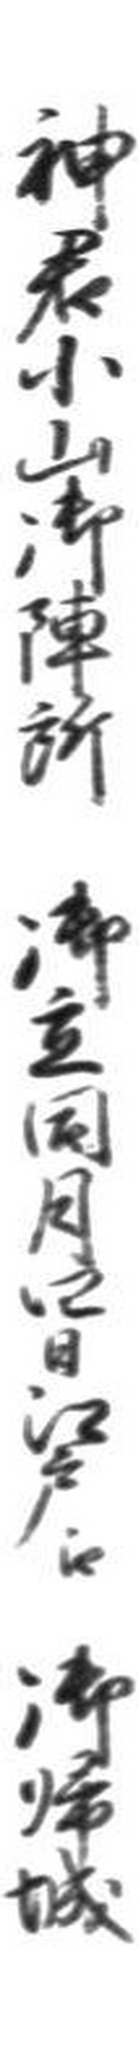神君小山御陣所御立同月四日江戸江御帰城
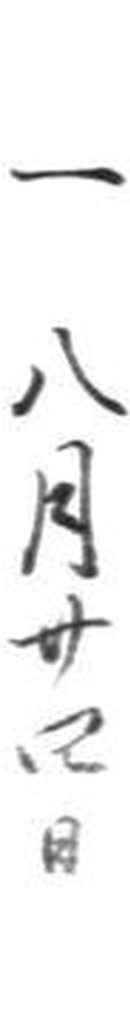一八月廿四日
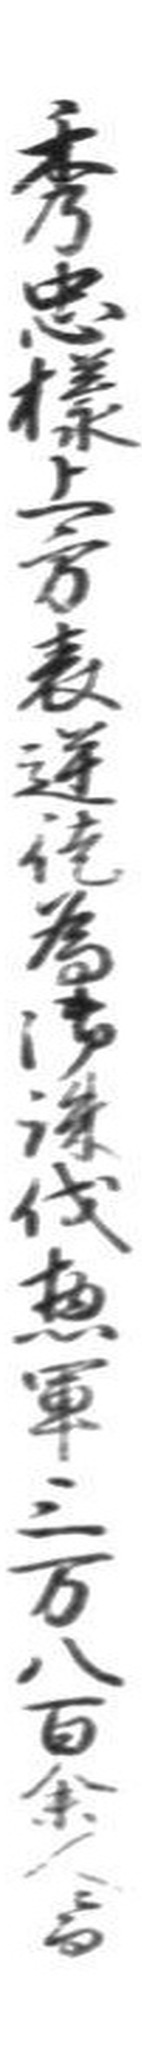秀忠様上方表逆徒為御誅伐惣軍三万八百余人ニ而
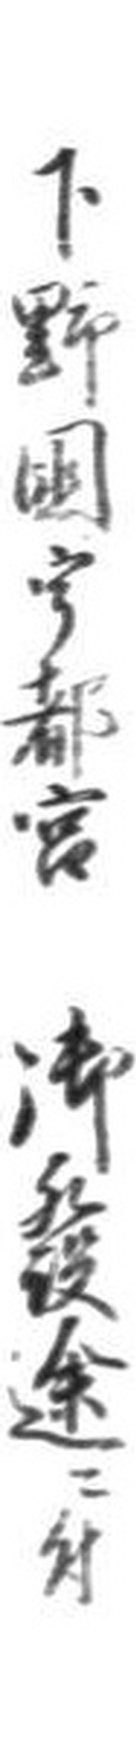下野国宇都宮御発途二付
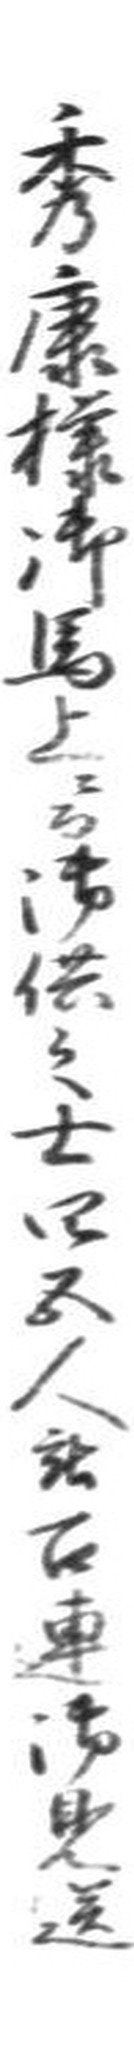秀康様御馬上ニ而御供之士四五人被召連御見送
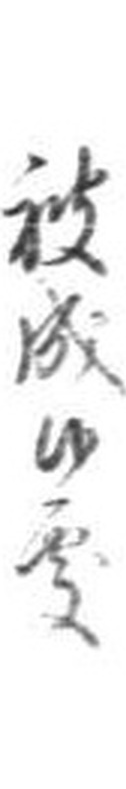被成候処
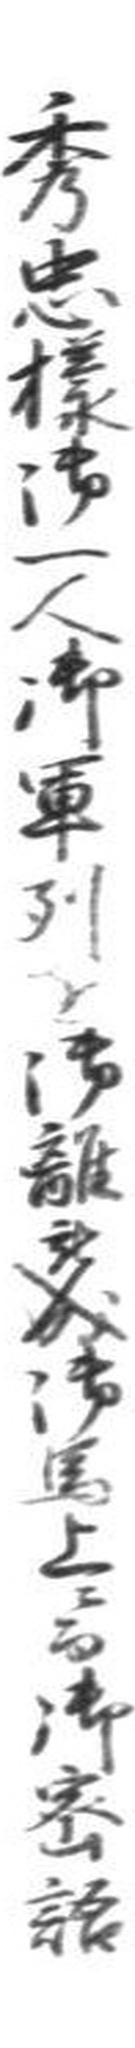秀忠様御一人御軍列を御離被成御馬上ニ而御密語
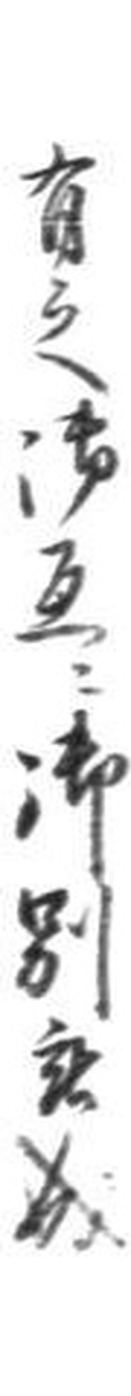有之御互ニ御別被成

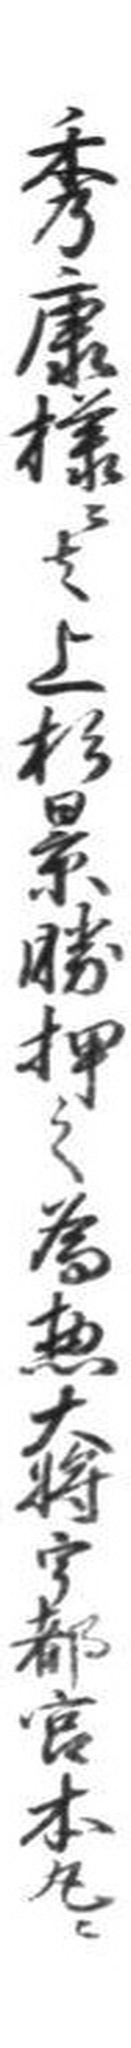秀康様ニ者上杉景勝押之為惣大将宇都宮本丸ニ
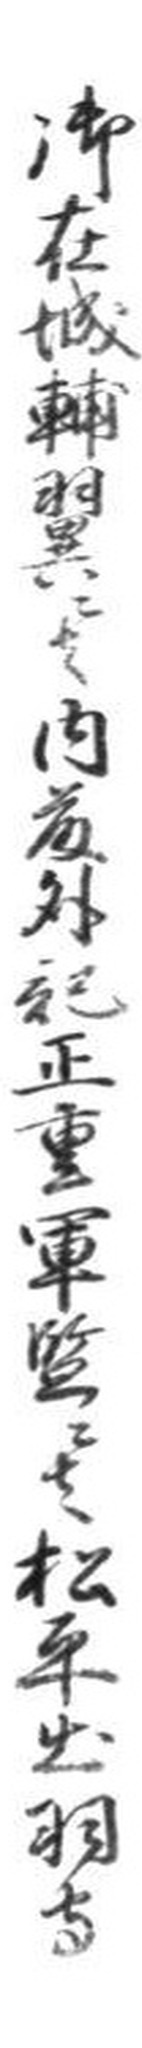御在城輔翼ニ者内藤外記正重軍監ニ者松平出羽守
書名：家譜 一 秀康公 従天正二年到慶長十二年
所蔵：福井県文書館 Fukui Prefectural Archives
